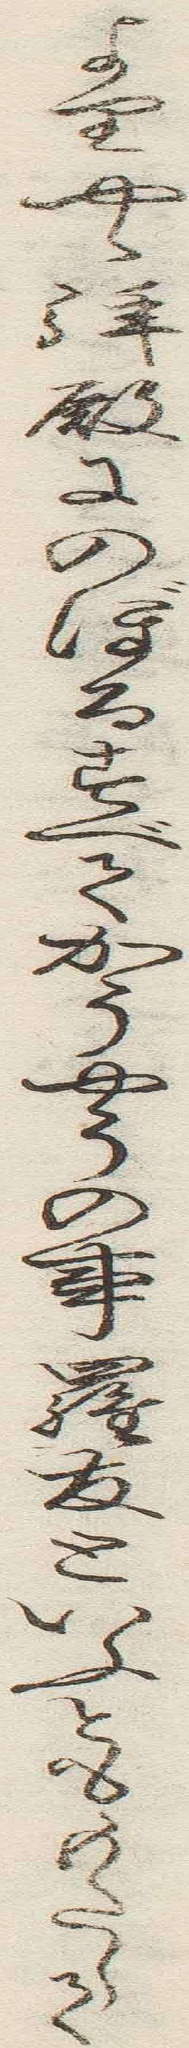よりやゝ拝殿にのぼるすべてかうやうの事羅友といふとももたして
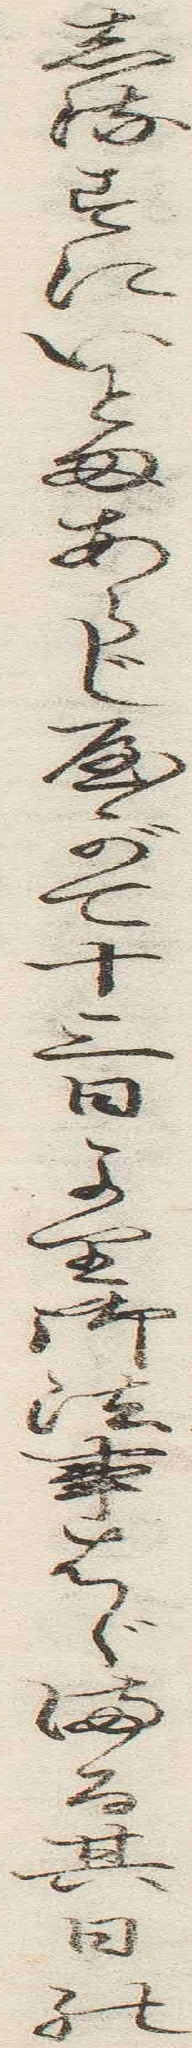しるすにいとまあらじやがて十三日より御法事はじまる其日の
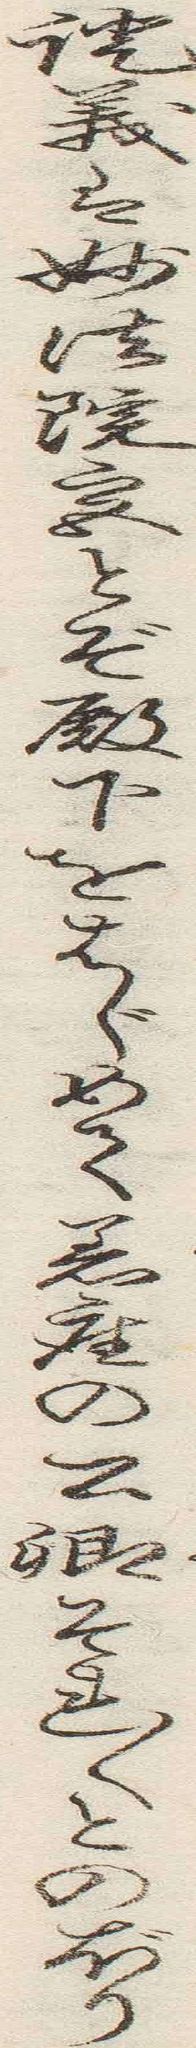證義は妙法院宮とぞ殿下をはじめて着座の公卿それ〳〵とのぼり
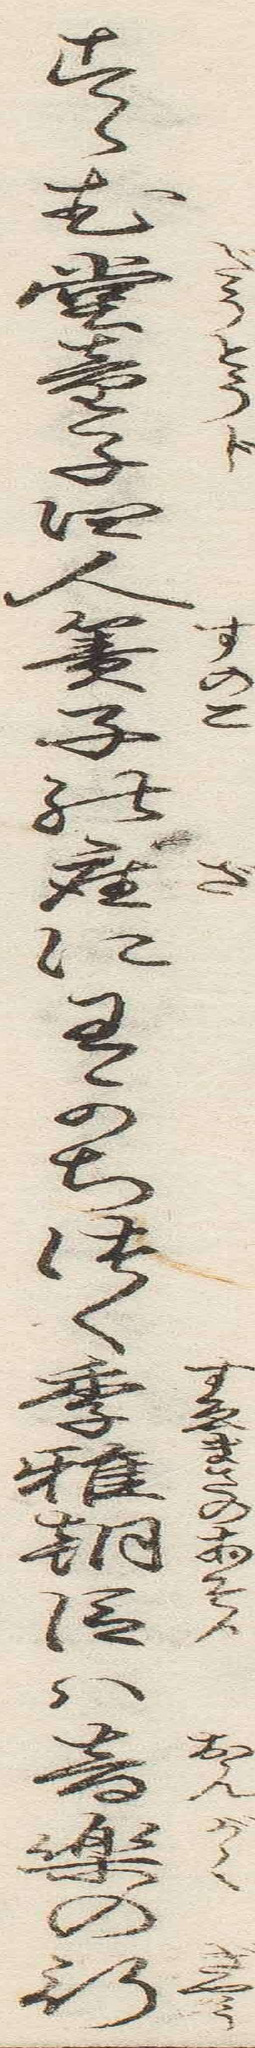すゝむ堂童子四人簀子の座にわかちつく季雅朝臣は音樂の行
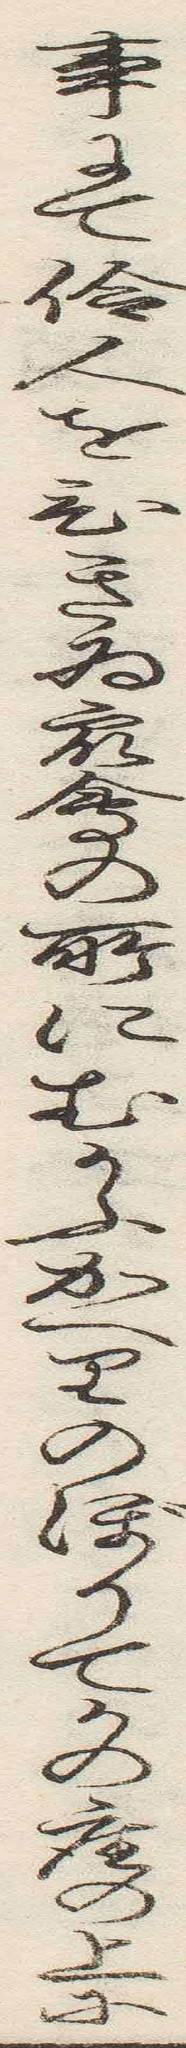事にて伶人をひきゐ衆會の所にむかふかへりのぼりてかの座の上に
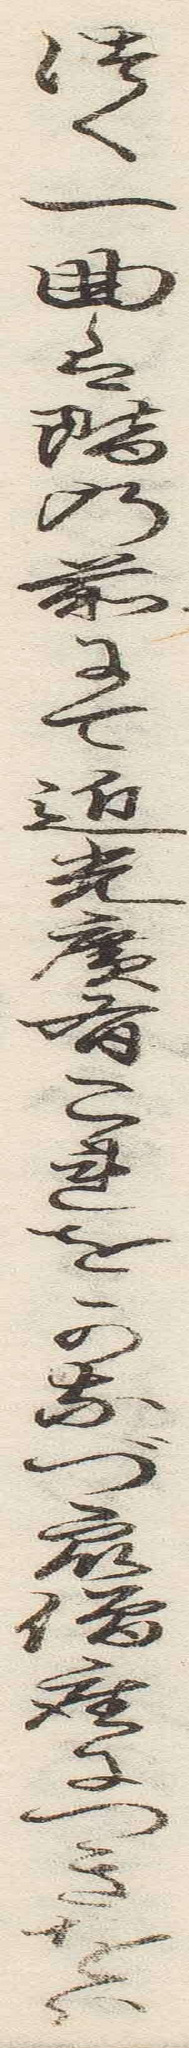つく一曲は階の前にて近光廣有これをかなづ衆僧座につきをは
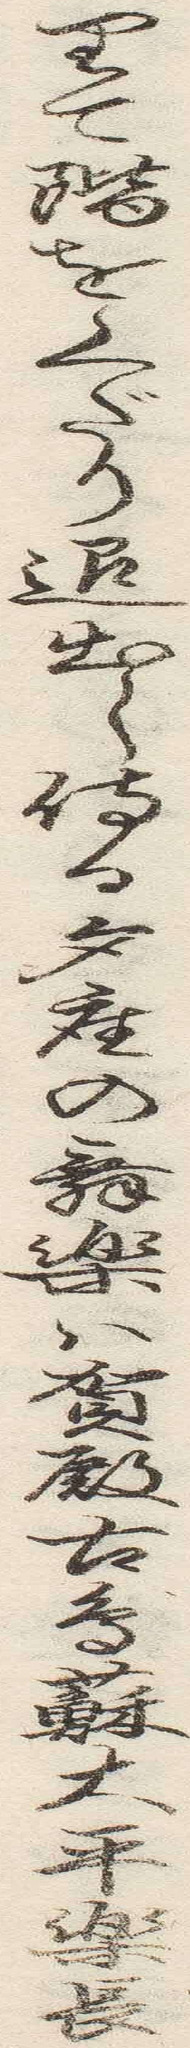りて階をくだり退出し侍る夕座の舞樂は賀殿古鳥蘇太平楽長
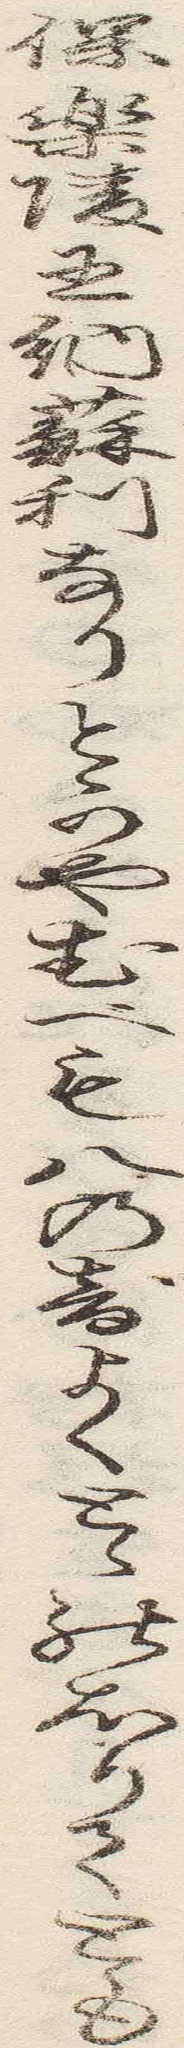保樂陵王納蘇利なりとかやむべも八の音よくとゝのほりてとも
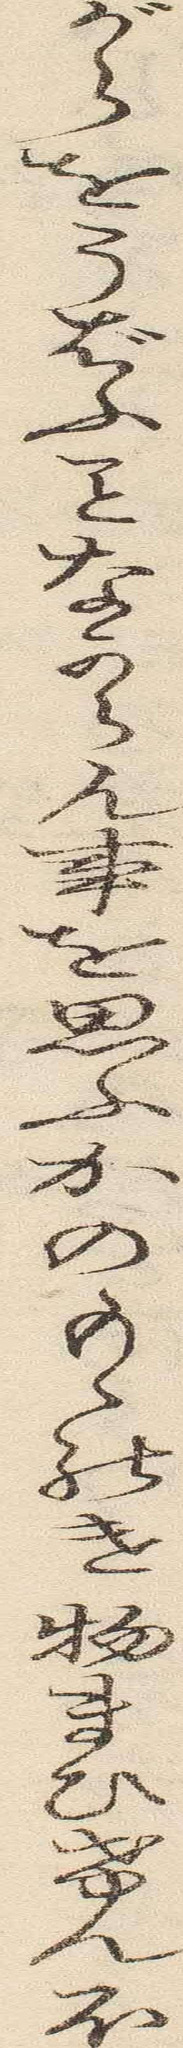がらをうばふことなからん事を思ふかのもゝのけ物まひけんほ
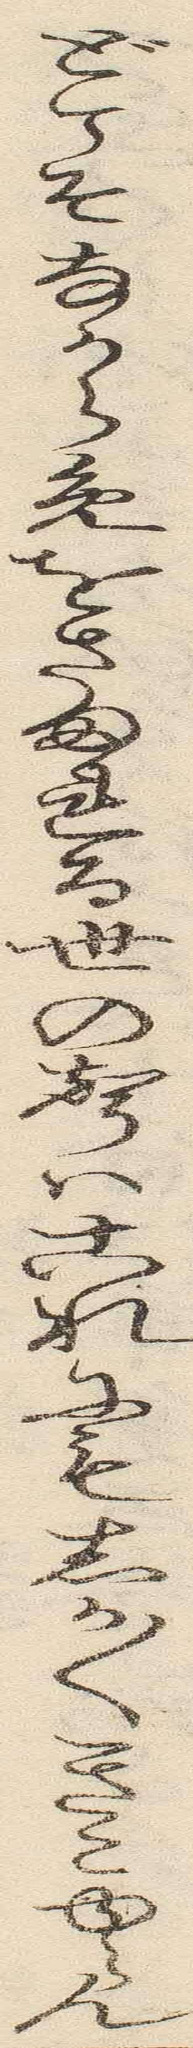どこそなからめをさまれる世の聲はこれにもしか〳〵きこゆらん
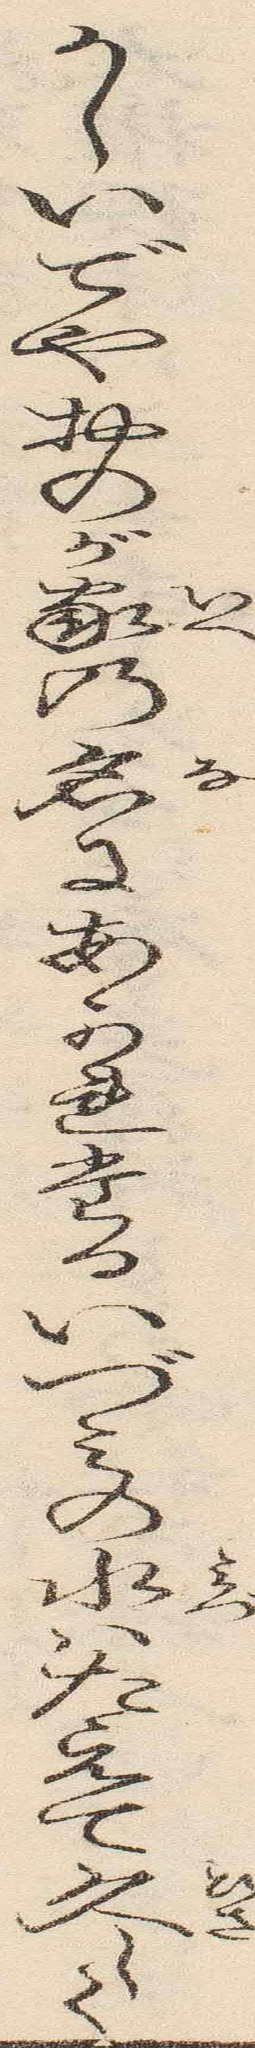かしいでやおのが家の名にあかれたるいづみの水はたえて久しく
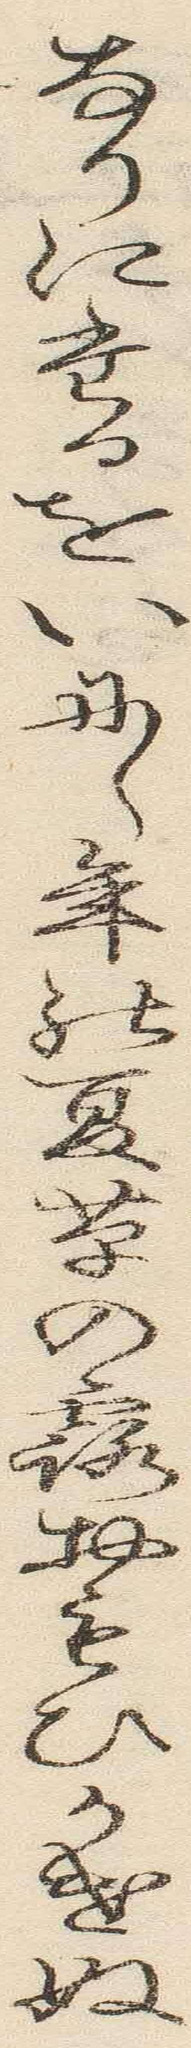なりにたるをいにし年の夏草の露おもひかけぬ
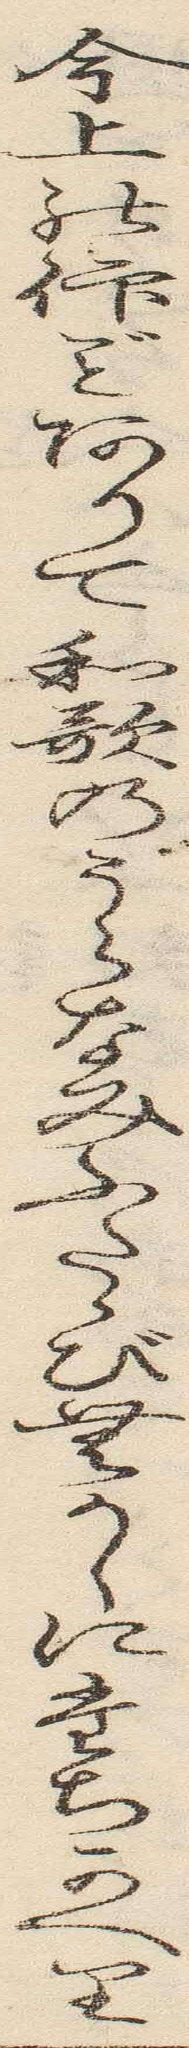今上の仰ごとありて和歌のうらなみふたゝびむかしにたちかへり
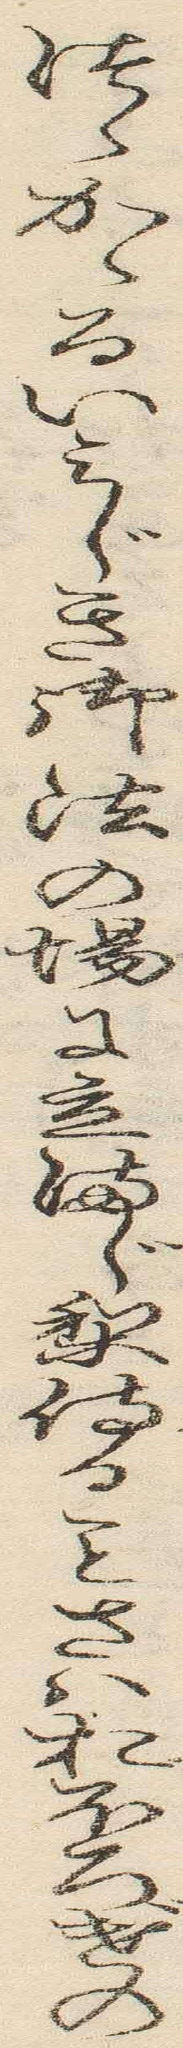つゝかゝるいみじき御法の場に立まじり侍ることさはおほろげの
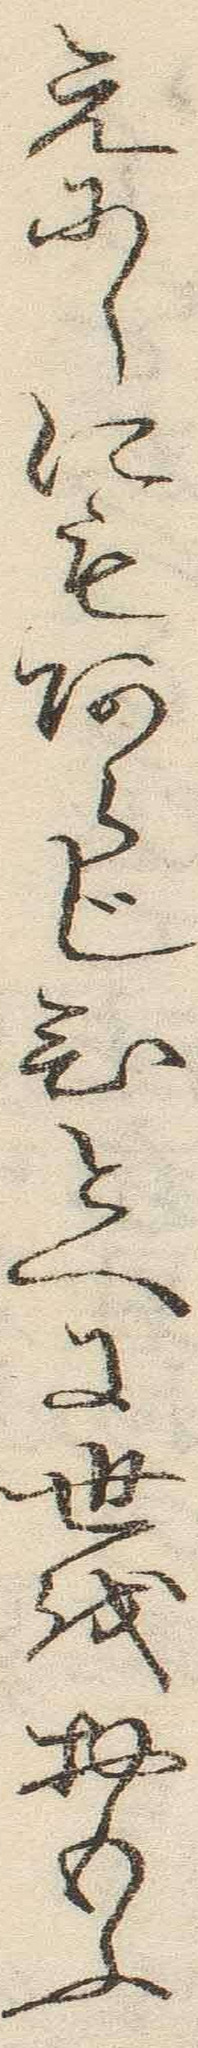えにしにもあらじひとへに世をおもふ
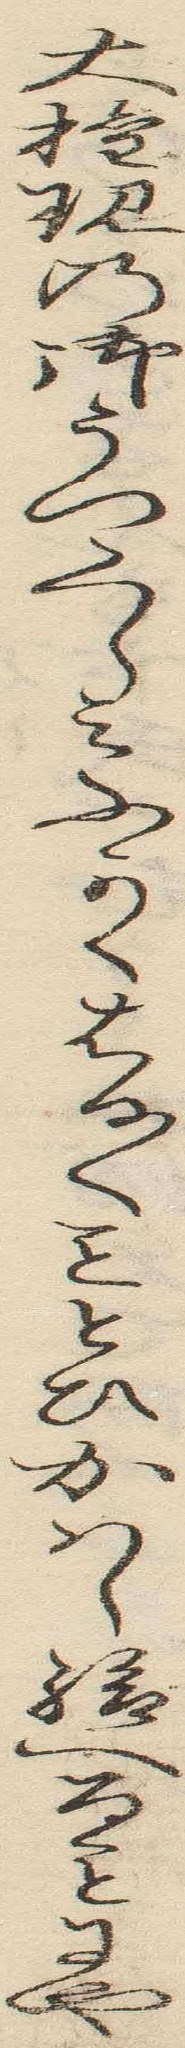大權現の御うつくしみふかくはる〳〵こととひかはし給へることにや
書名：日光山志
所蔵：東京学芸大学附属図書館 国文学研究資料館
